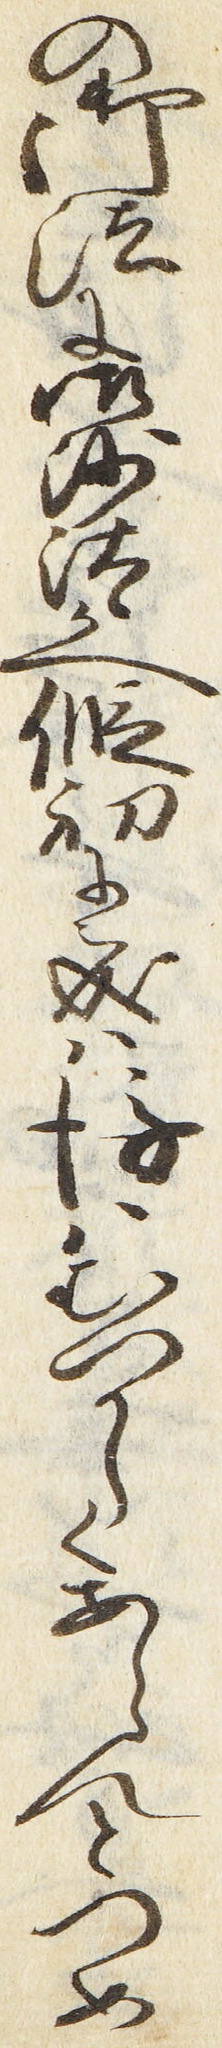の御法に御沙汰候へ假初に被成は後はむつかしくあらんとつめ
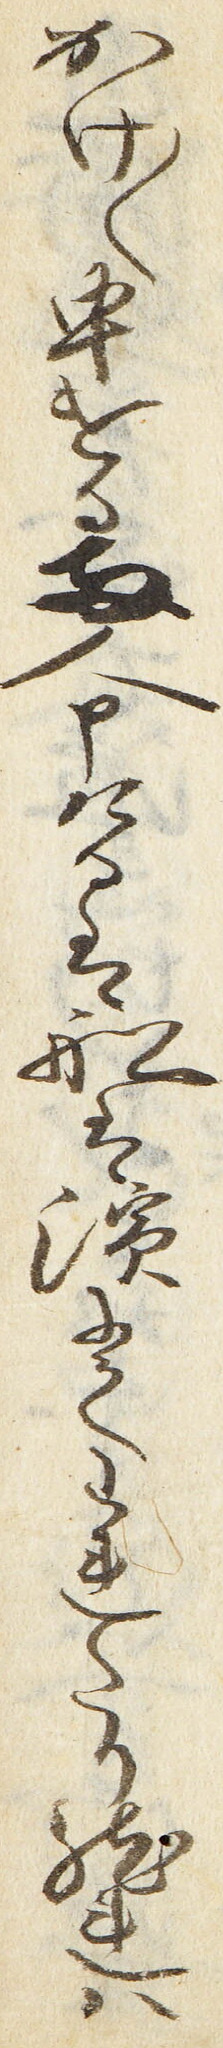かけ〳〵申ける両人申けるは船は浜にてわれたり然れハ

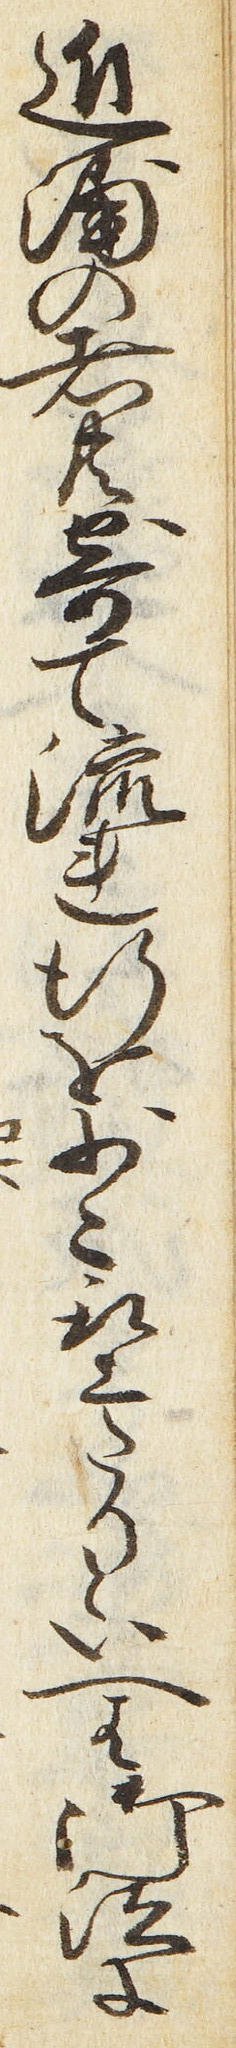近浦の者共寄て流れ行を少々取上たりといへは御法に
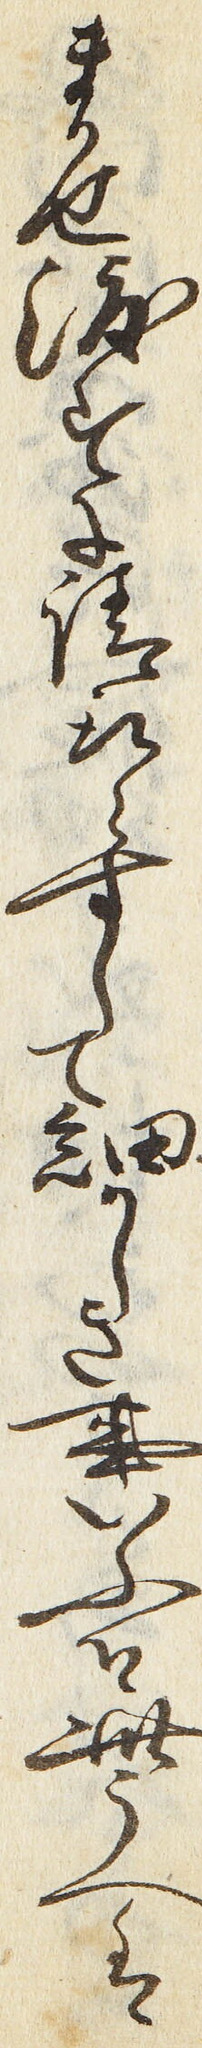まかせ渡すに請取らすして細かしき事いふそ此うへは
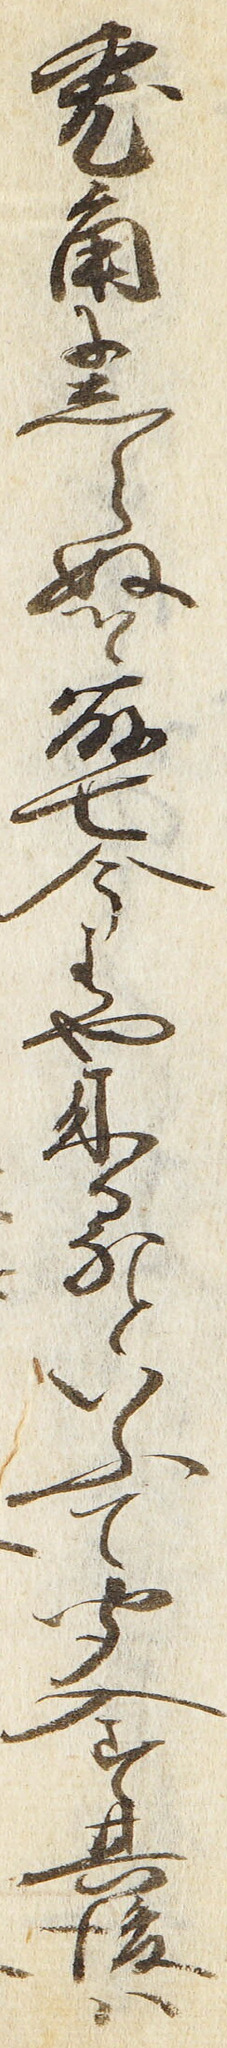兎角にしらぬそ藤七今はや来るなといふて聞入す其後は
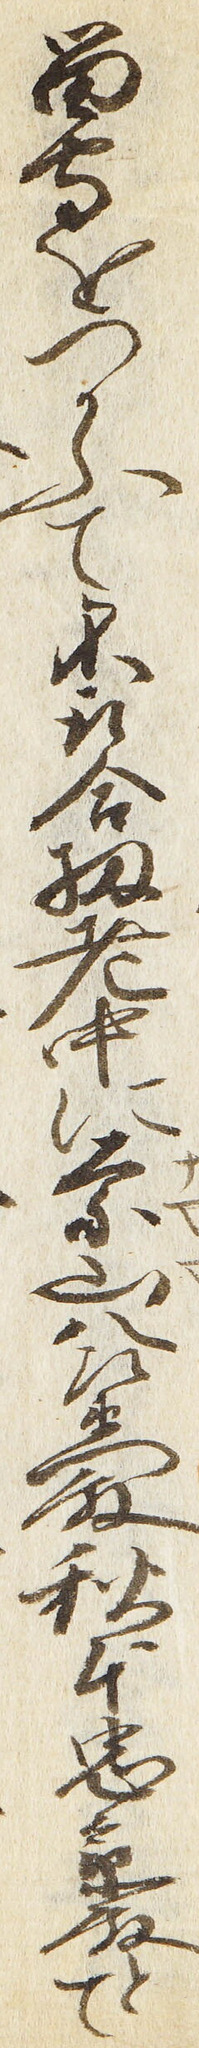留守をつかふて不取合扨老中に奈山八左衛門殿秋本忠兵衛殿とて
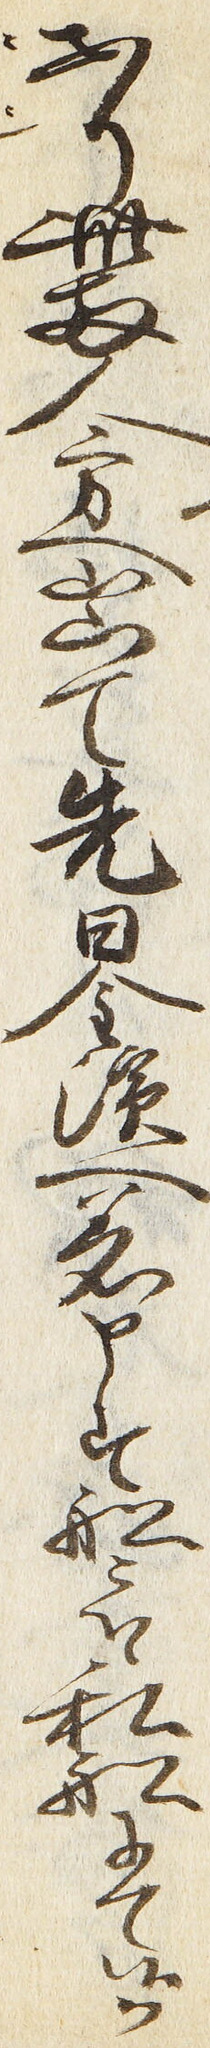あり此両人方へ出て先日金浜へ着申す船こそ私船にて候か
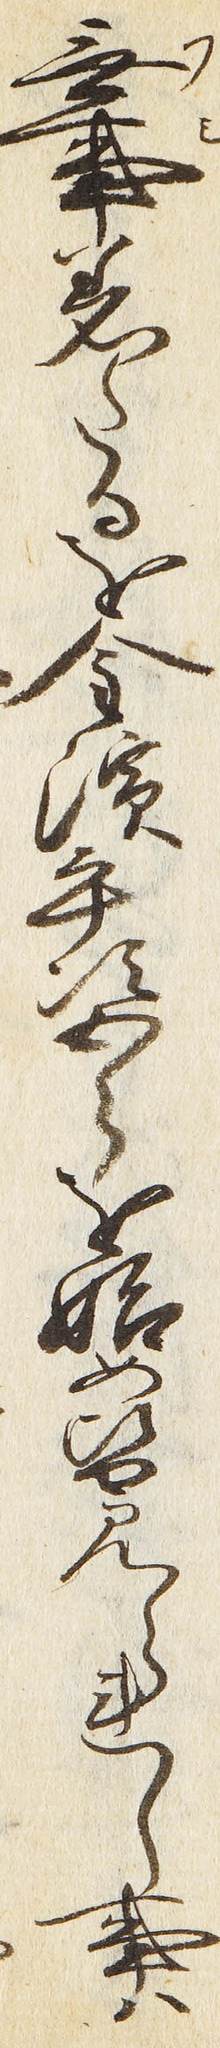無事着たるを金浜平次五郎を始め皆見られし事は
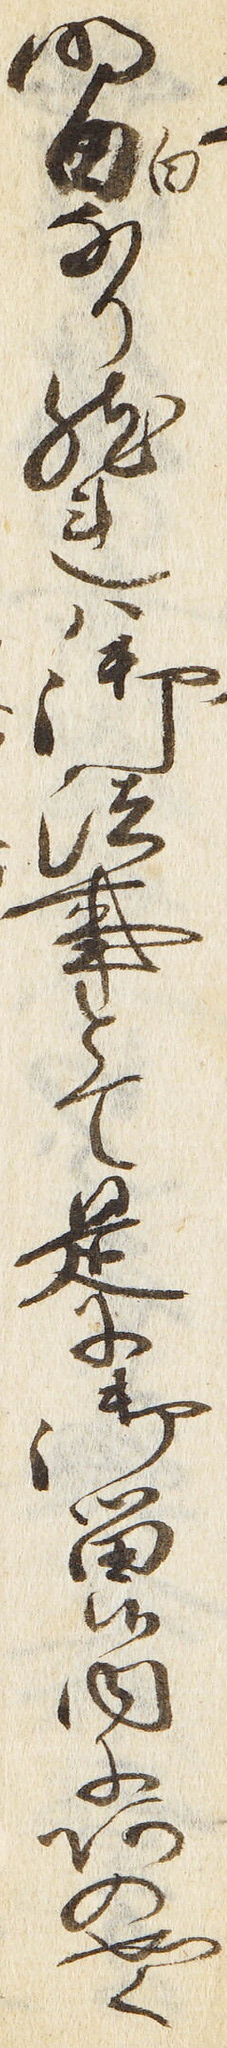明白なり然れは御法事とて是に御留候内にあの如く
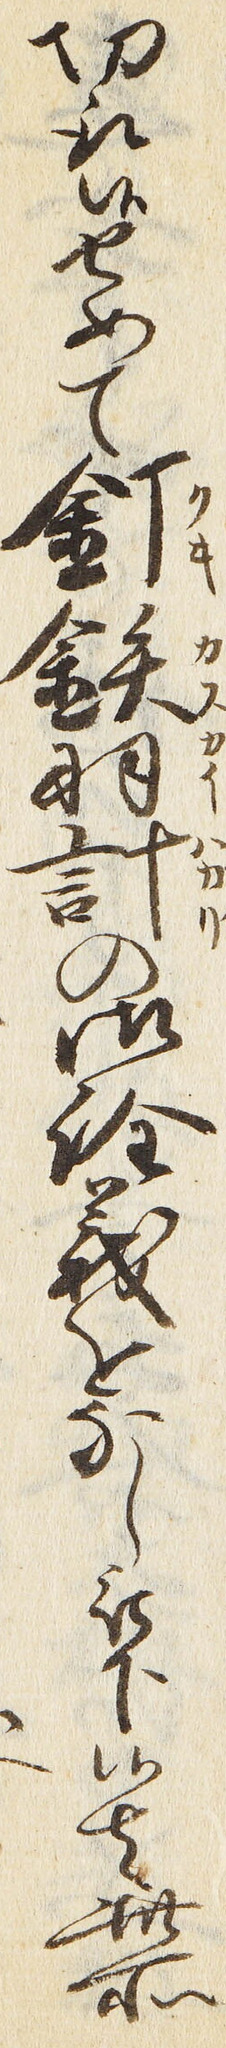切取候せめて釘鉄羽計の御詮義をなし被下候者此所
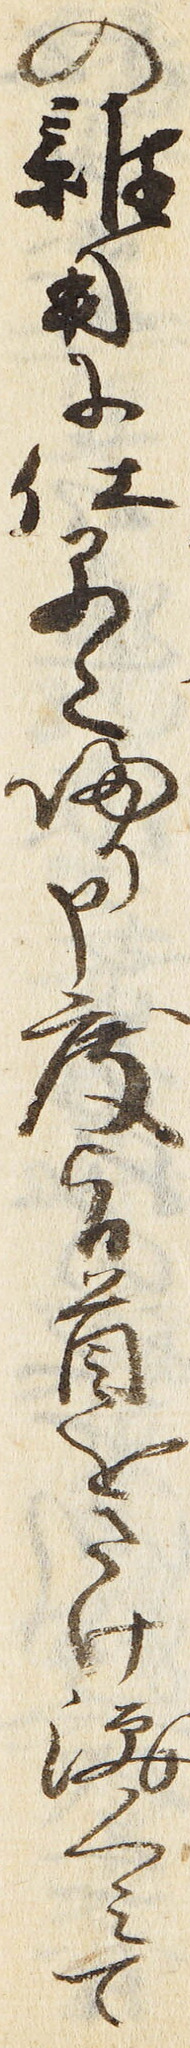の雑用に仕早々帰り申度旨首をさけ涙くみて
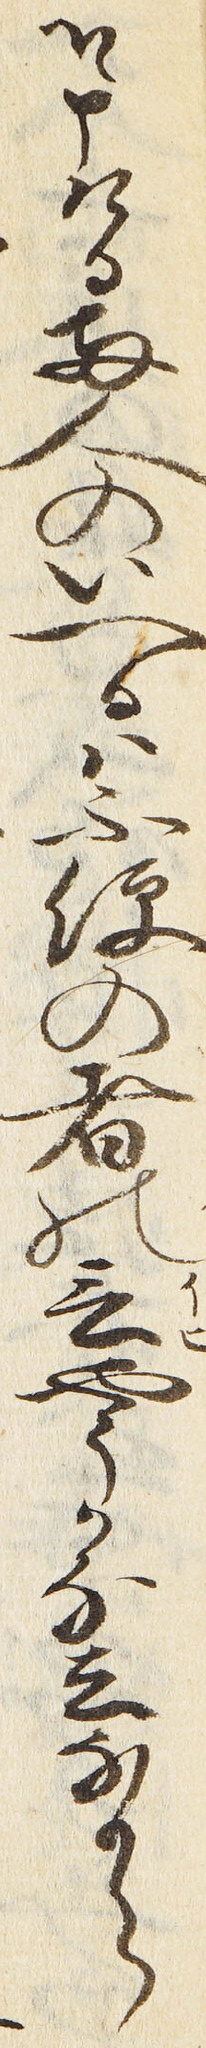そ申ける両人のいへるは不便の者の言やうかな去なから
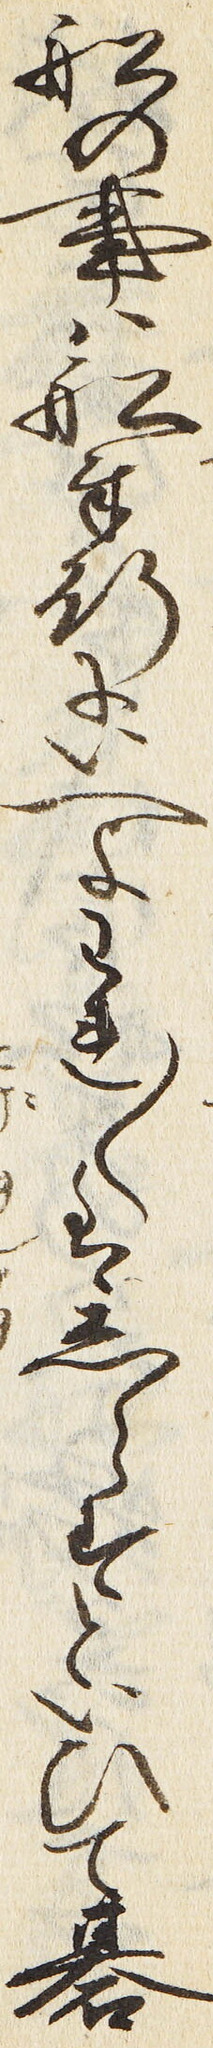船の事ハ船奉行にいへよわれ〳〵はしらすといひて碁
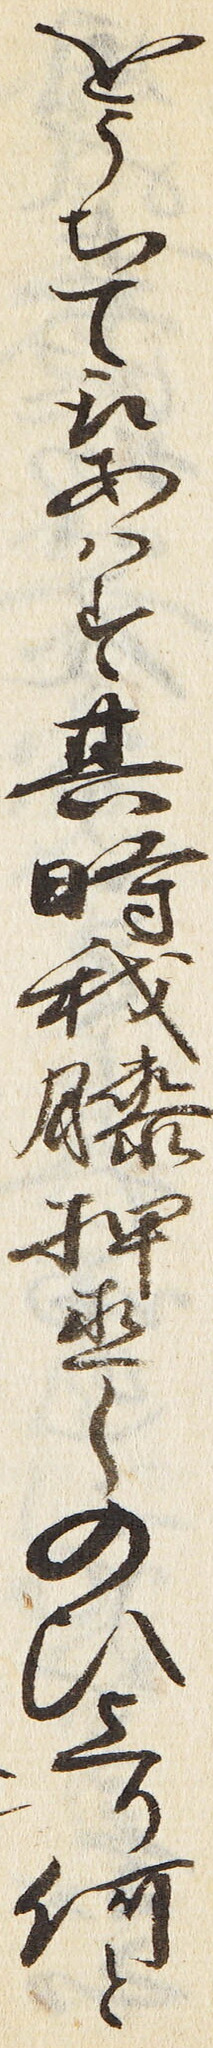をうちて取あはす其時我膝押直しのひ上り何と
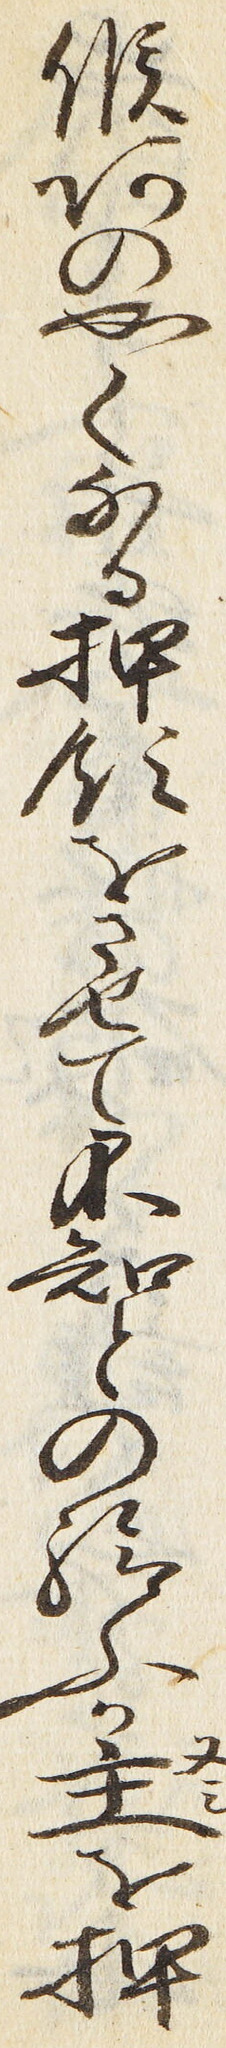候あの如くなる押領をさせて不知との給ふか主を押
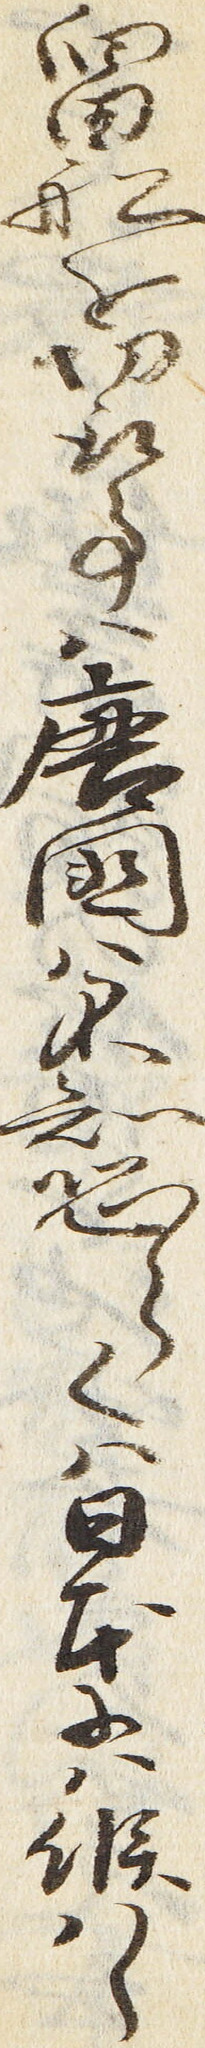船を切取事は唐国は不知恐らくハ日本には候はし
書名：海陸世話日記
